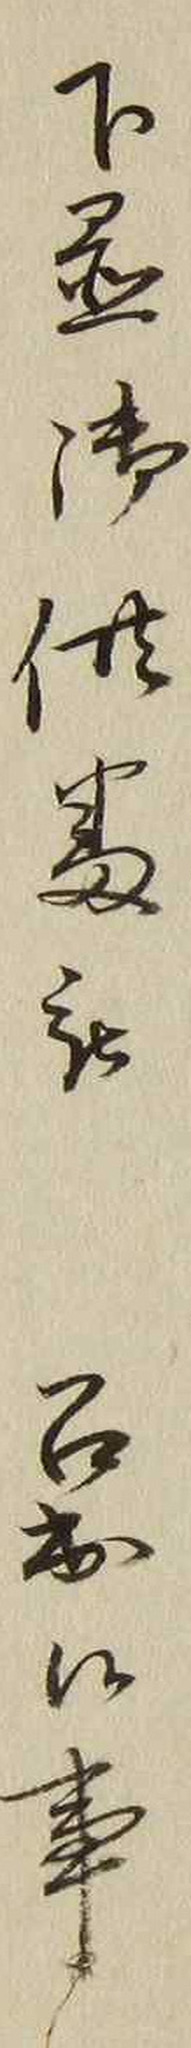下置御供番被召出候事
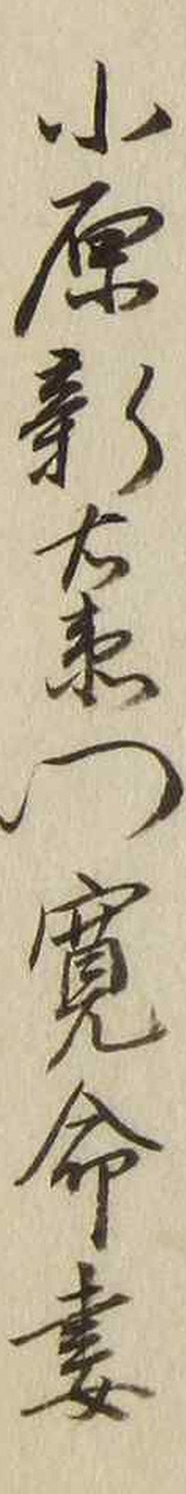女小原新右衛門寛命妻

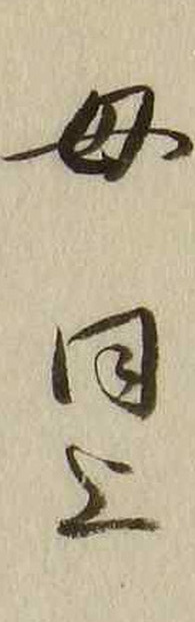母同上
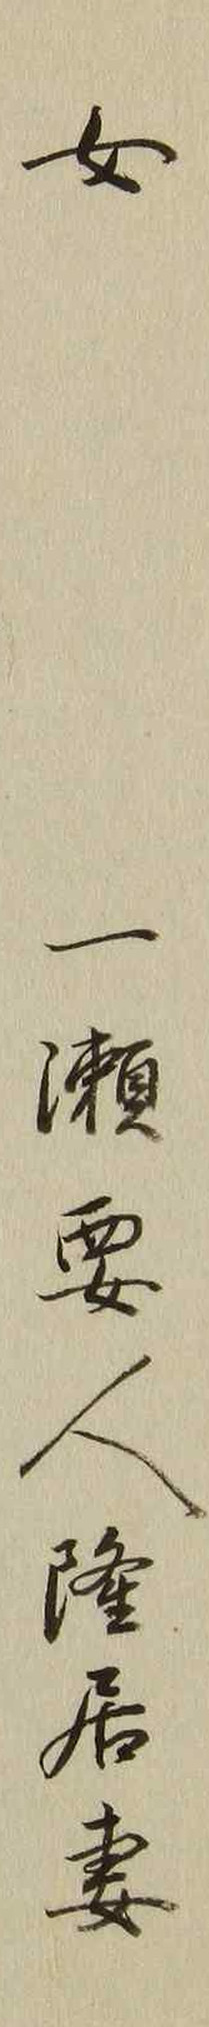女一瀬要人陸居妻
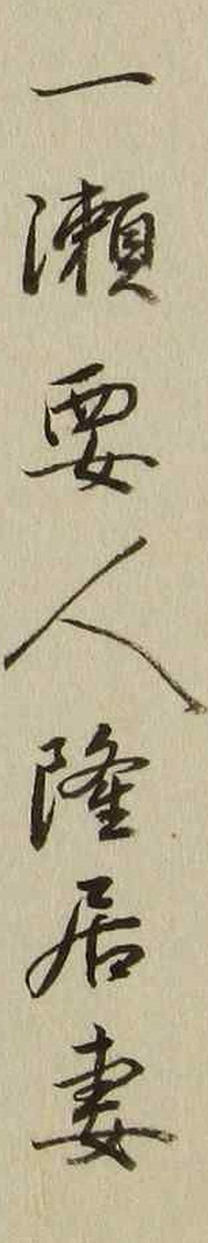女一瀬要人陸居妻
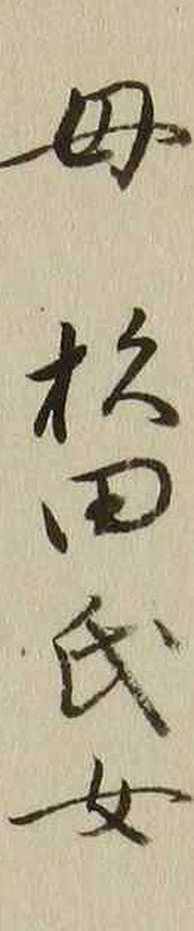母杉田氏女
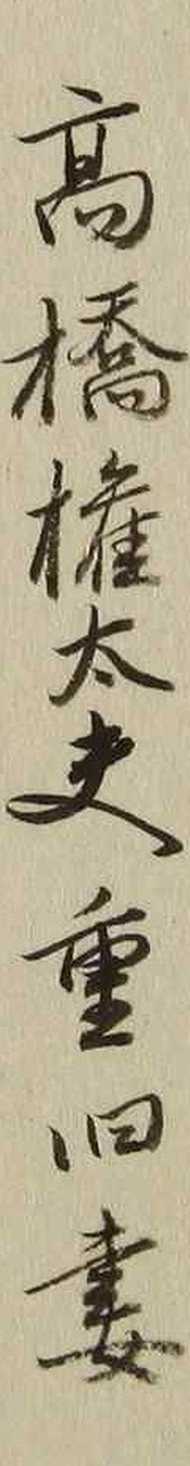女高橋権太夫重旧妻
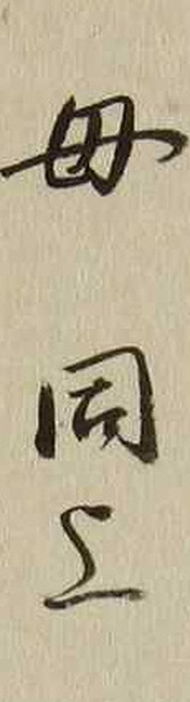母同上
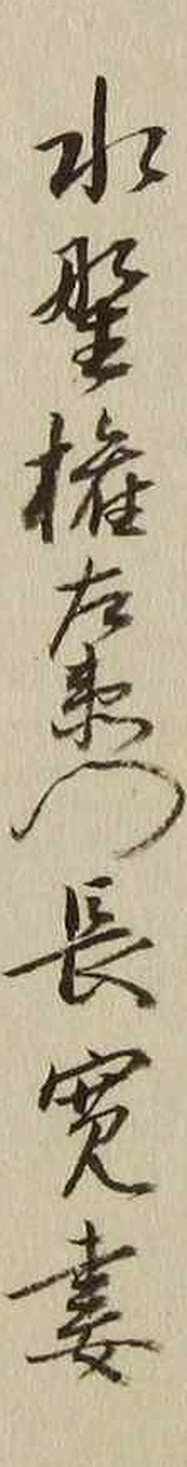女水野権左衛門長寛妻
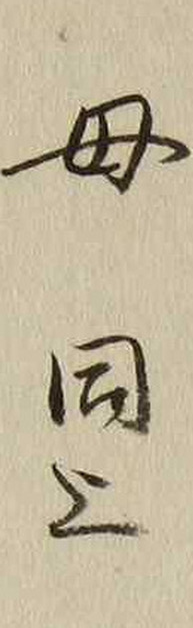母同上
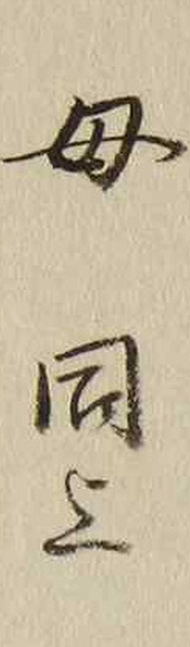母同上
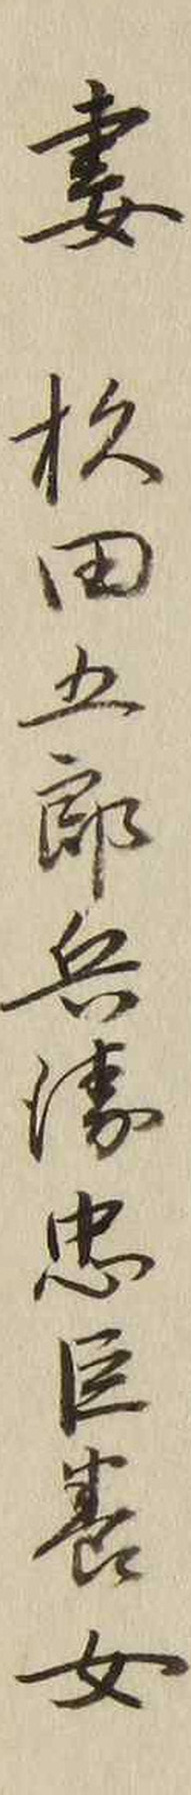妻杉田五郎兵衛忠臣養女

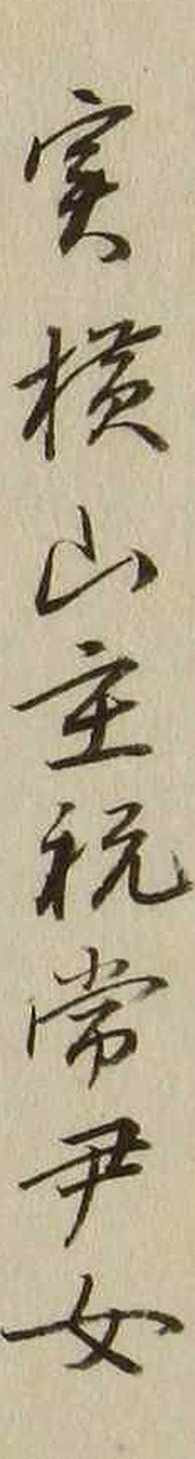実横山主税常尹女
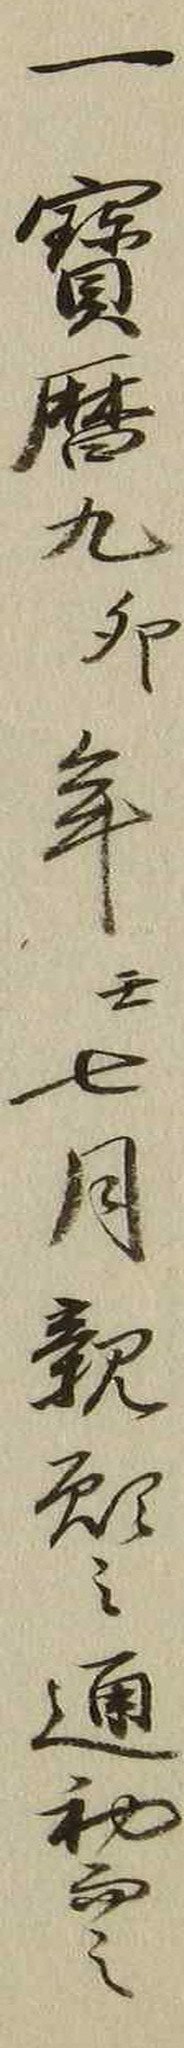一宝暦九卯年閏七月親願通初而之
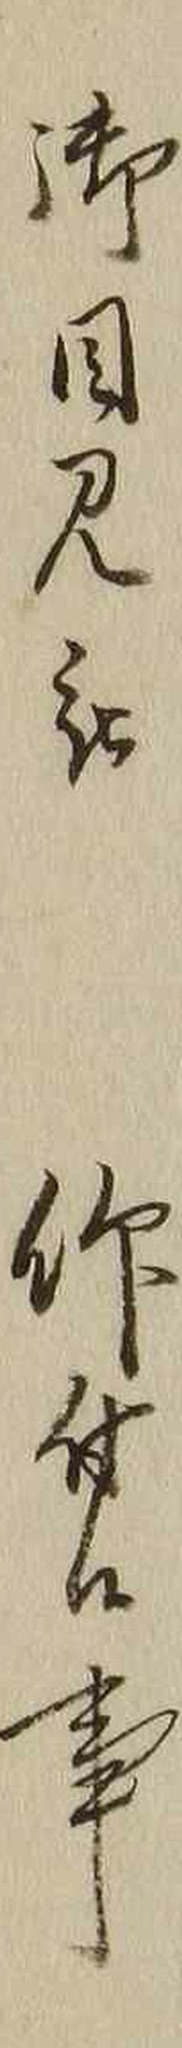御目見被仰付候事
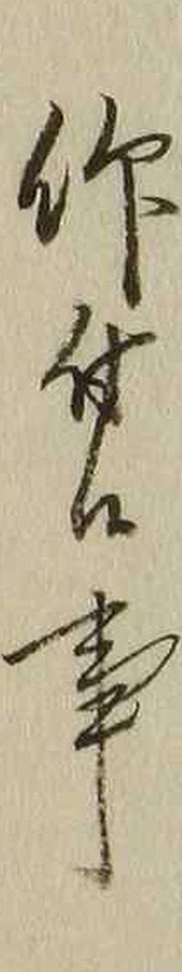仰付候事
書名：諸士系譜　巻之133　た之部9
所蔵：会津若松市立会津図書館
